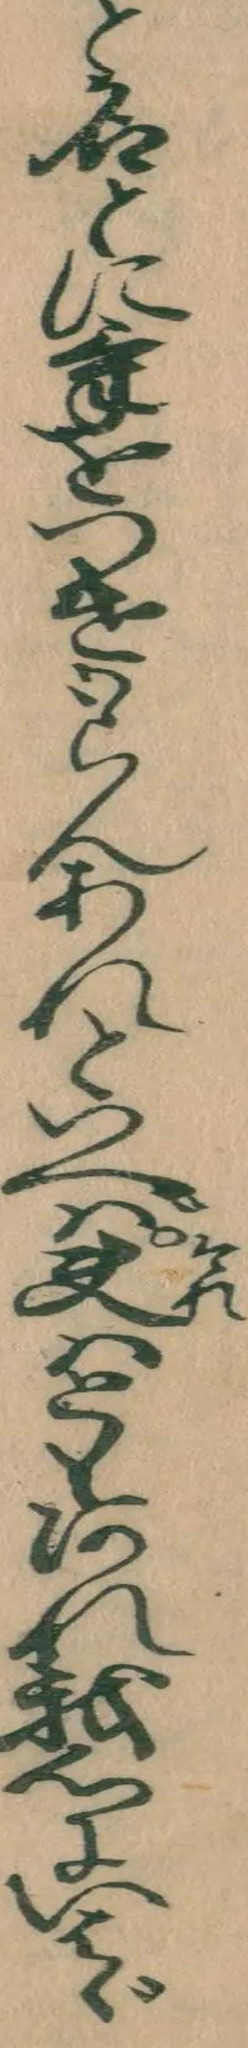と名とに気をつけ御らんあれといへば。夫はともあれ我心にいはゞ
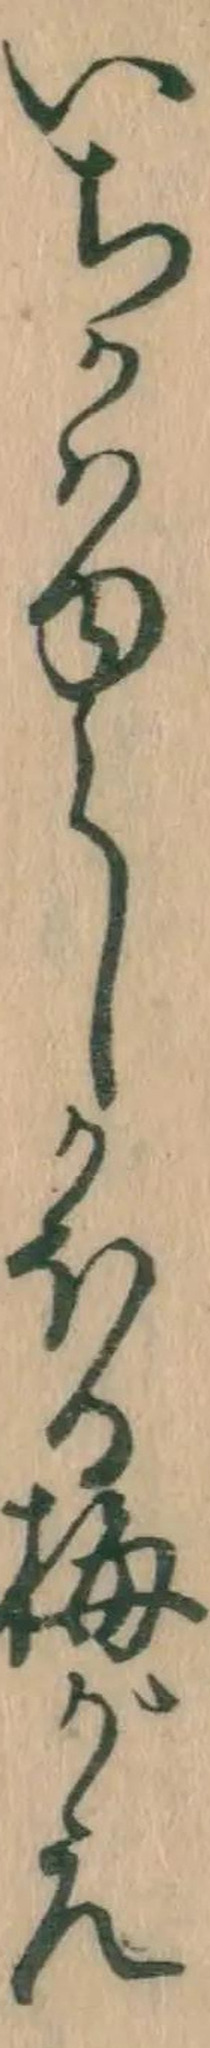いちかはゆらしかほる梅がえ
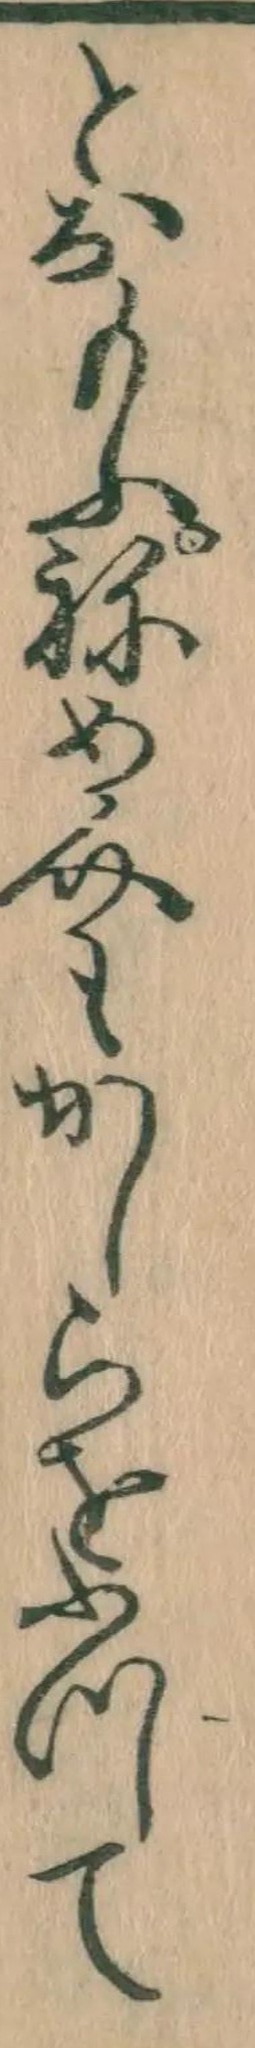とおもふ。ねめ介もかしらをふつて
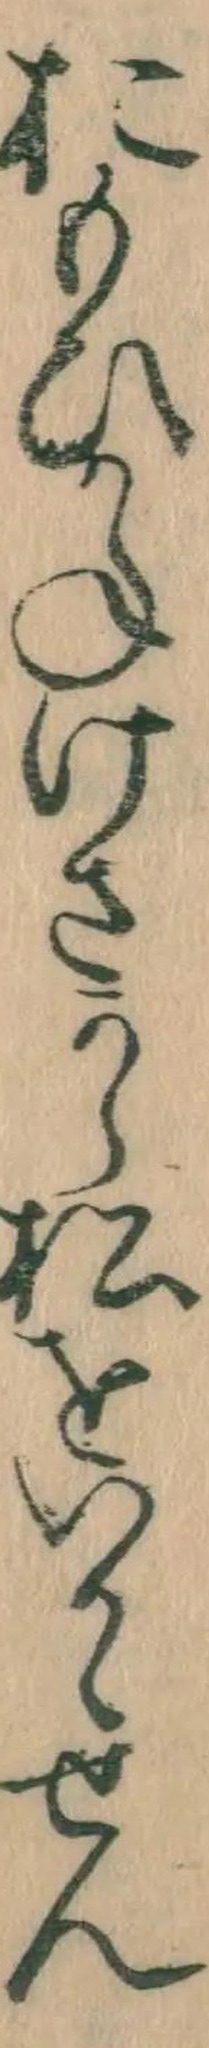おもひかねけさから松をいかゝせん
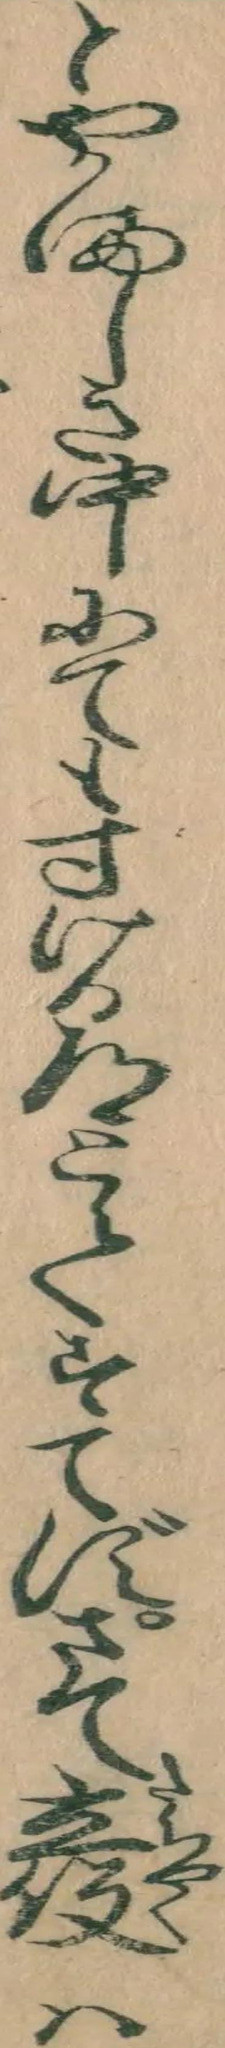とやかましき中にてもすける道とてすてず。さて立役は
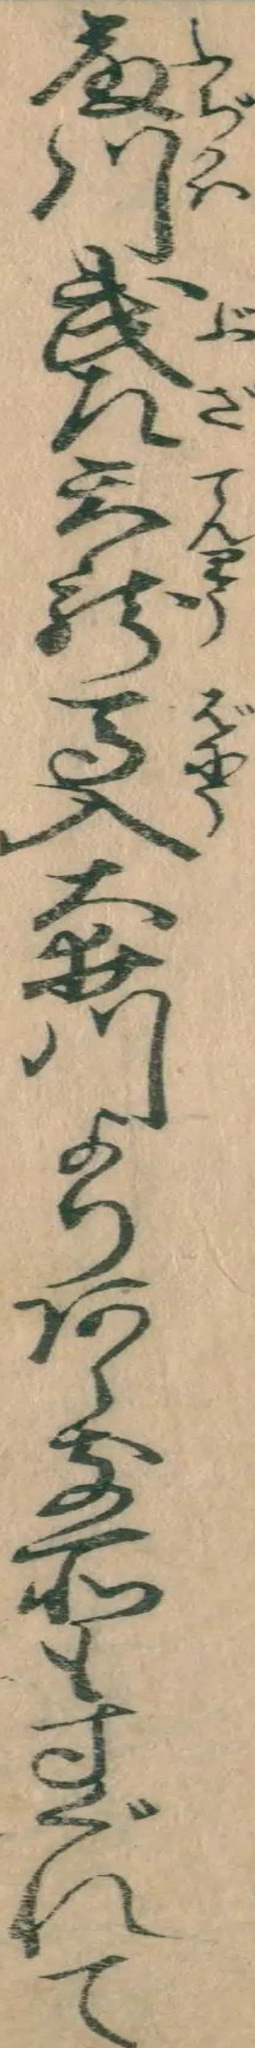藤川武左天竜馬入大井川よりあらき所もすぐれて
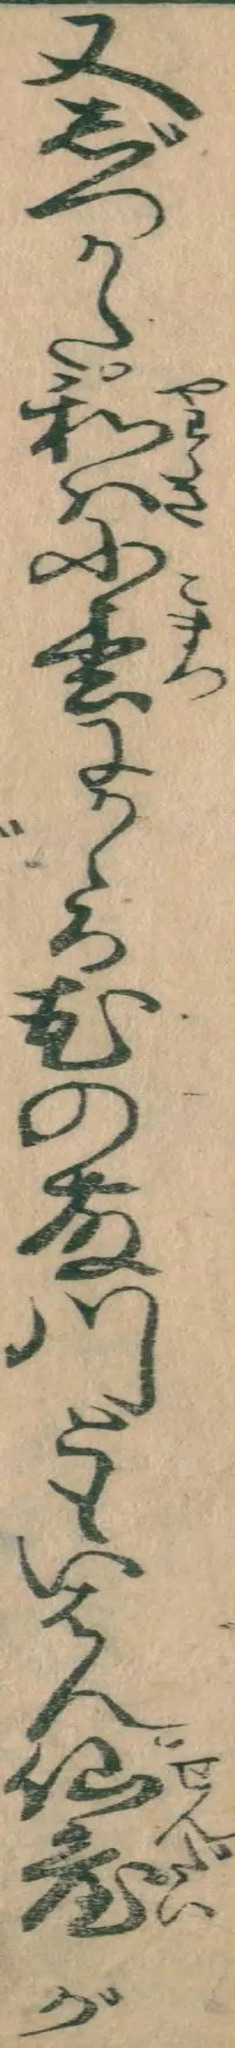又じつかた。和は小松にかゝる花の藤川ともいはん。仙台が
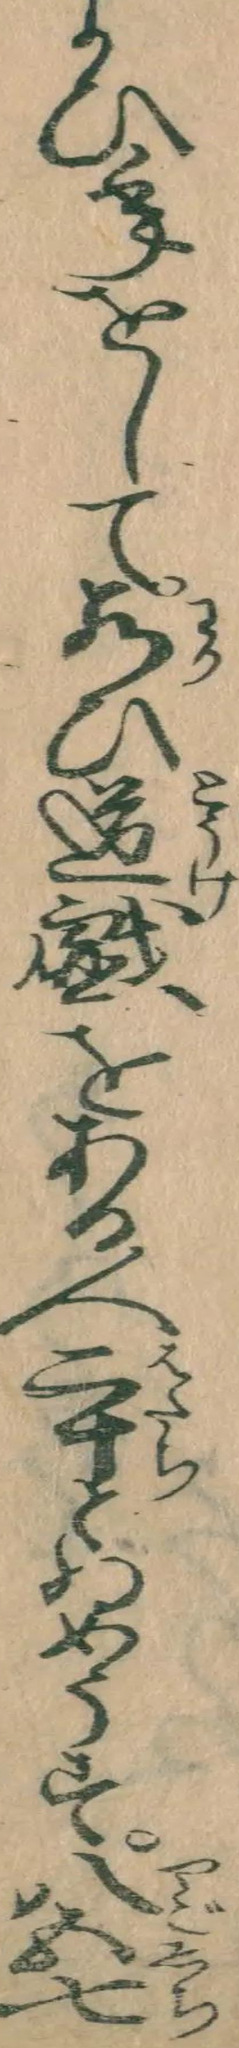よひ年をして。若ひ道戯をある人二十とゐめうす。八五七
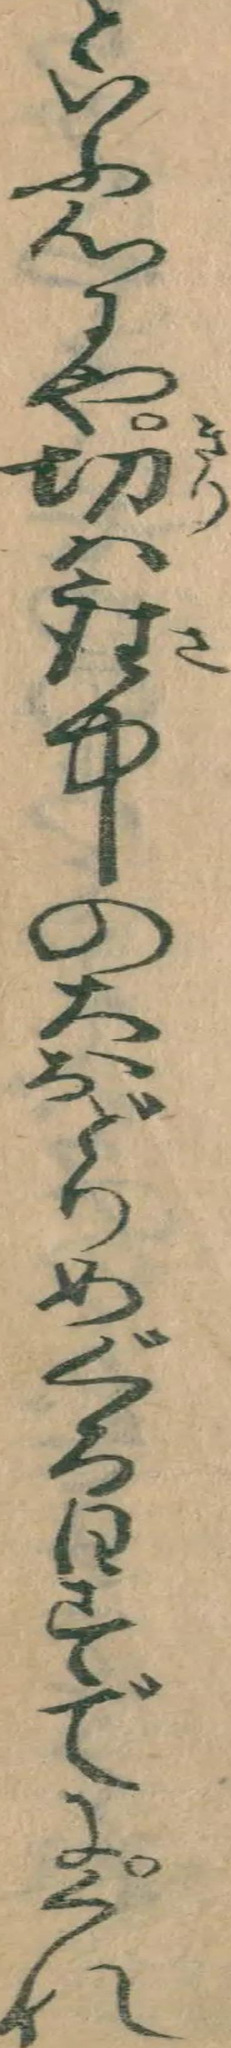といふ心にや。切は座中の大おどりめぐる日すでに。くれ

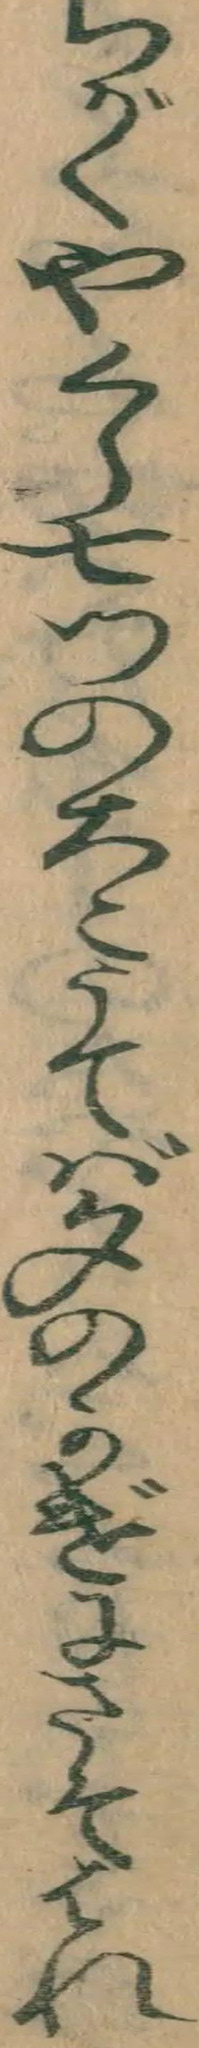ちがくやくら七つの大こうてば夕のかげにさそはれ
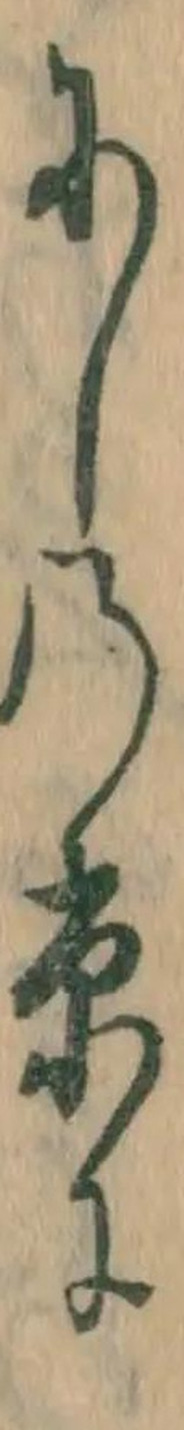にしの京に
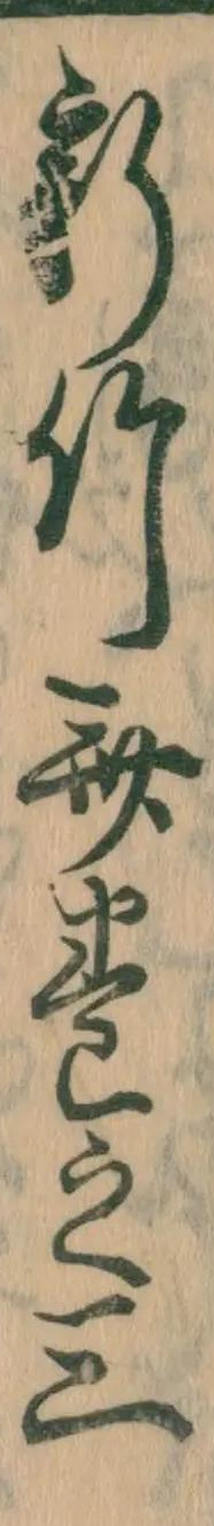新竹斎巻之三
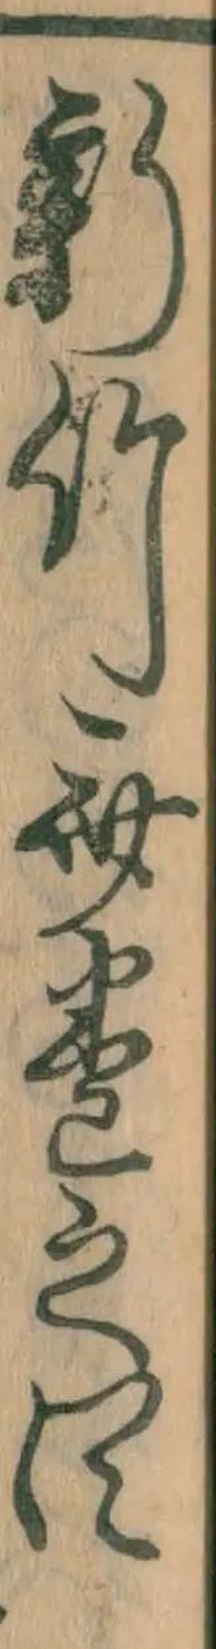新竹斎巻之三
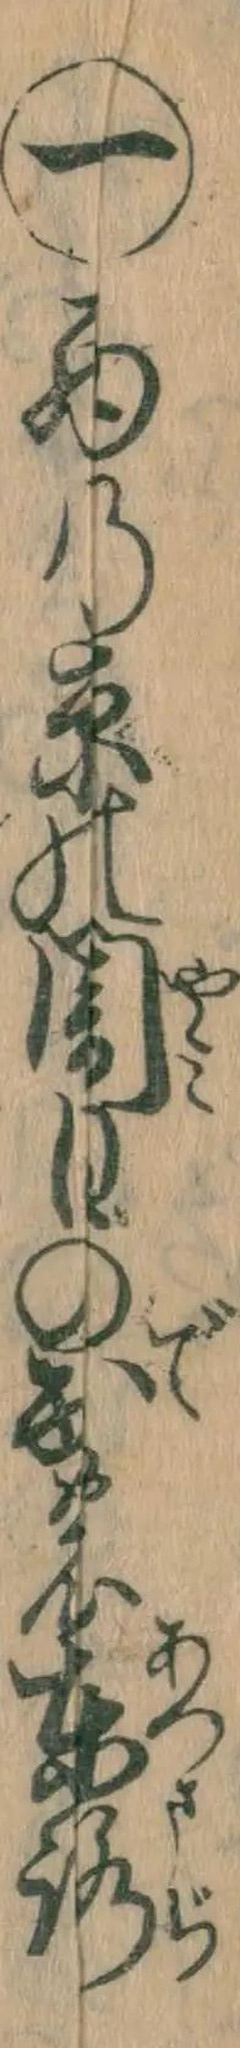一西の京の闇日の出の東路
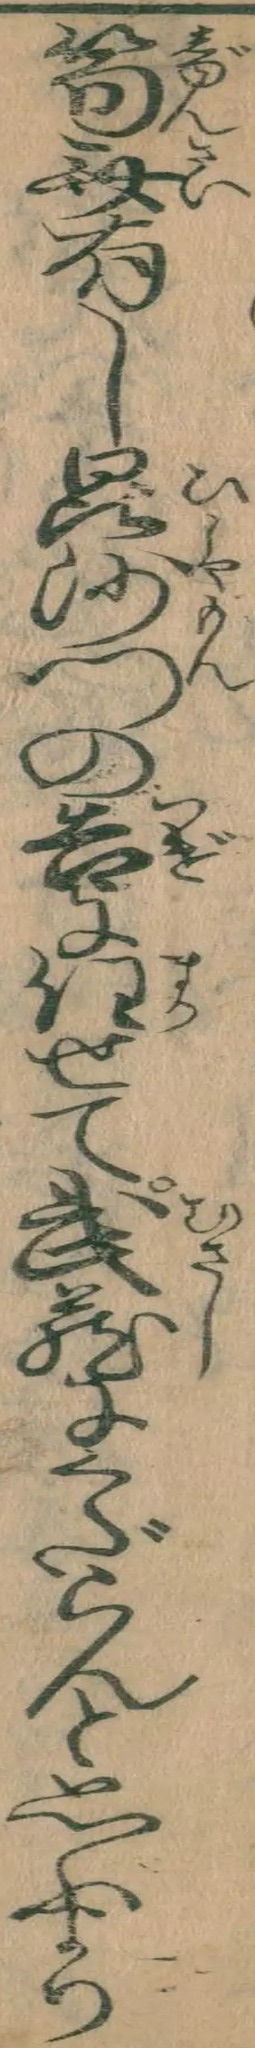筍斎有し毘沙門の告に任せて。武蔵にくだらんと思ふより
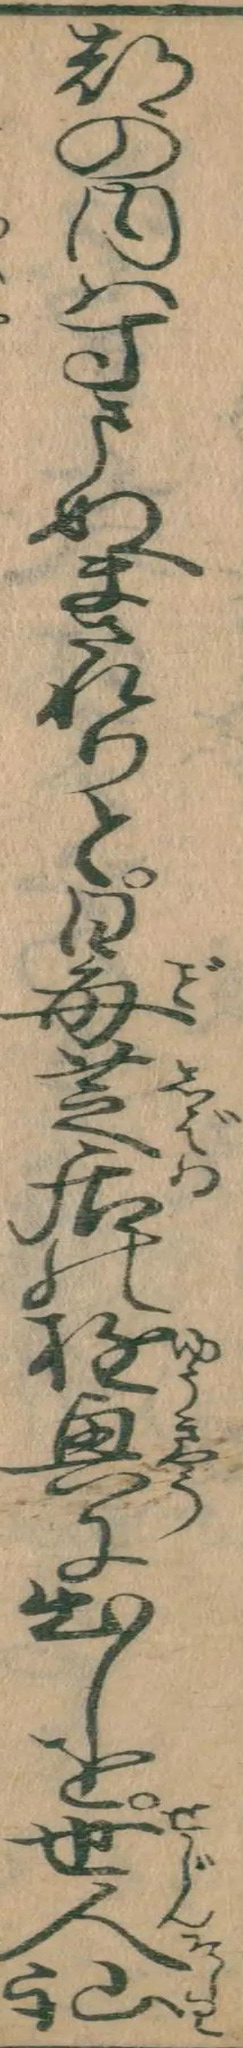都の内はすまぬまされりと。日毎芝居の遊興に出しを。世人訕
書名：新竹斎 5巻
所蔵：国立国会図書館 National Diet Library, JAPAN
